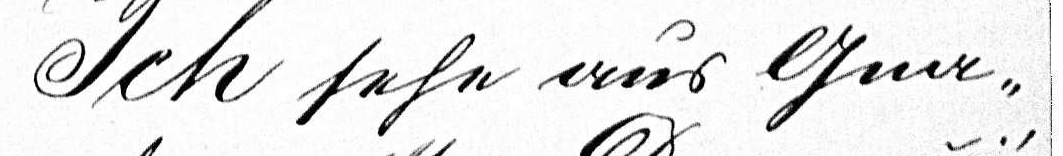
Ich sehe aus Gna¬
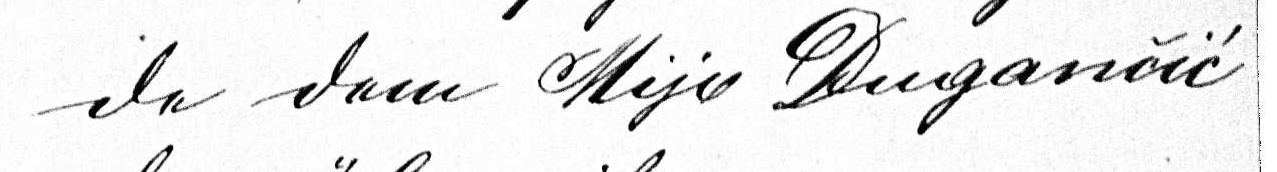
de dem Mijo Dugančić
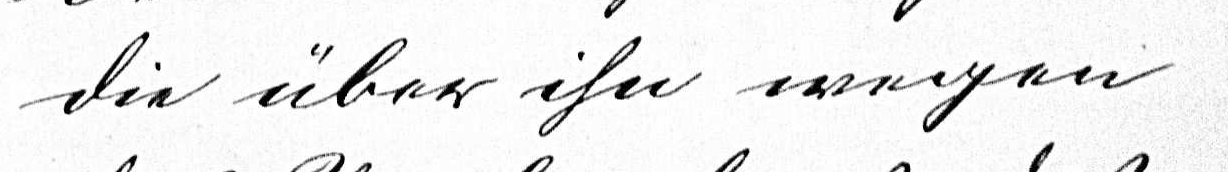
die über ihn wegen
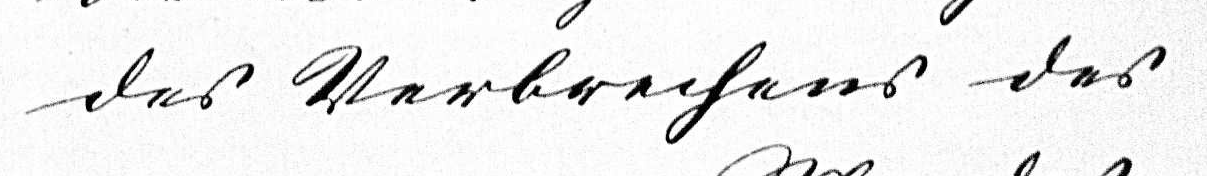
des Verbrechens des
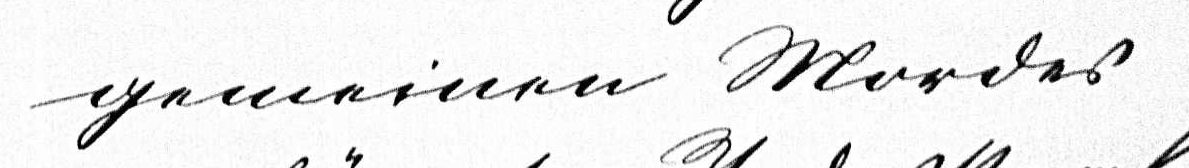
gemeinen Mordes
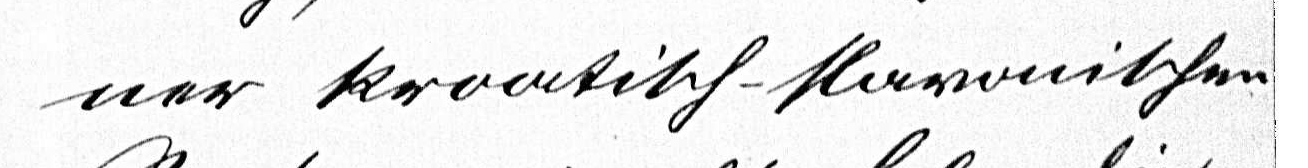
nem kroatisch-slawonischen
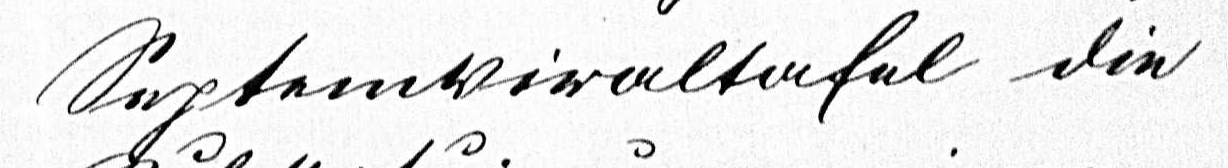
Septemviraltafel die
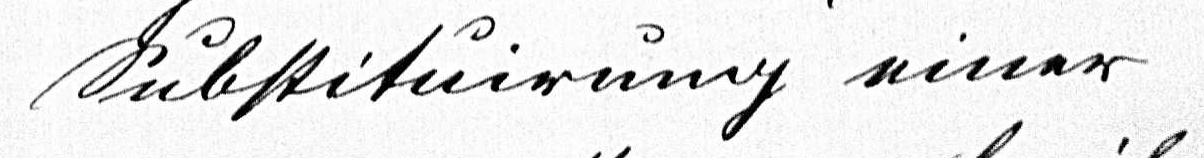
Substituirung einer
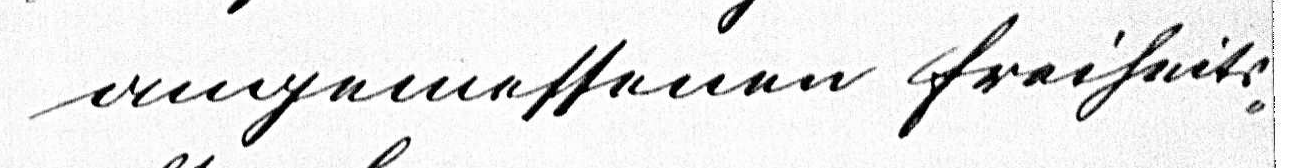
angemessenen Freiheits¬
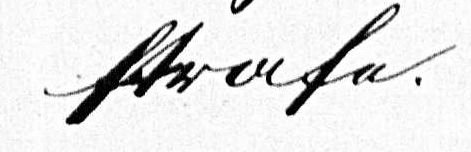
strafe.
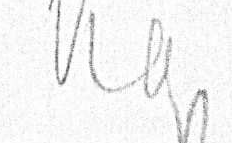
Kg
